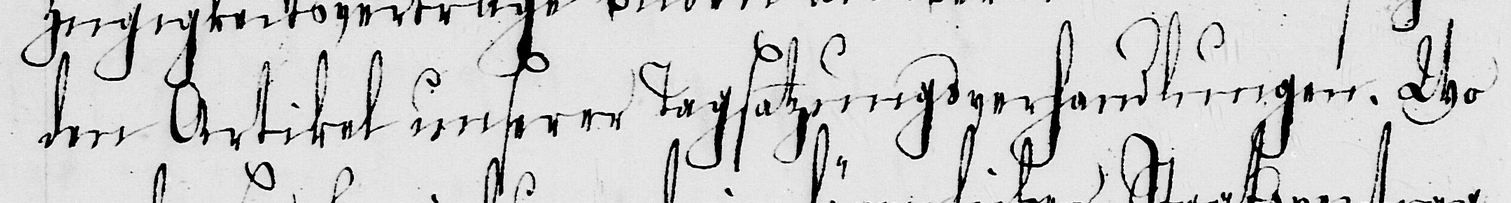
den Artikel unserer Tagsatzungsverhandlungen. Wo
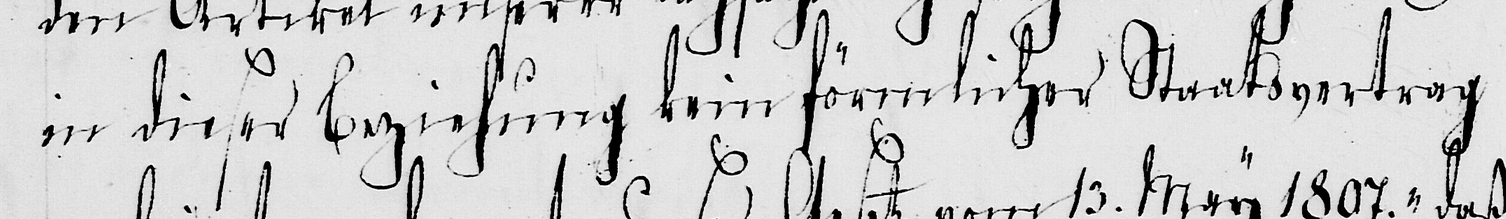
in dieser Beziehung kein förmlicher Staatsvertrag
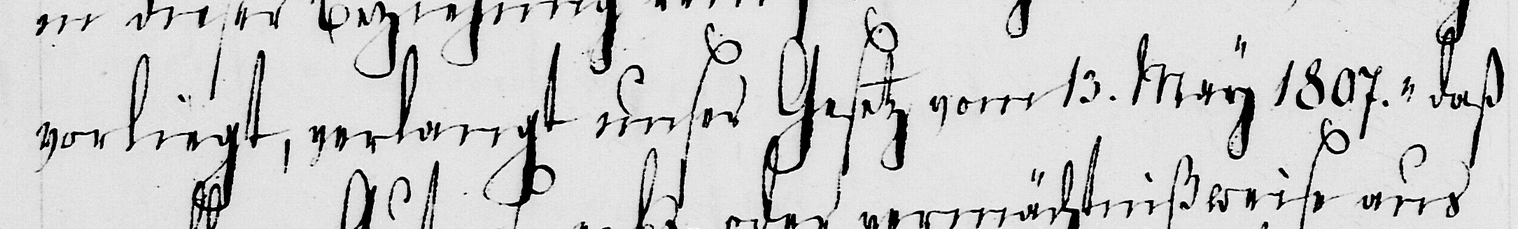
vorliegt, verlangt unser Gesetz vom 13. May 1807. „daß
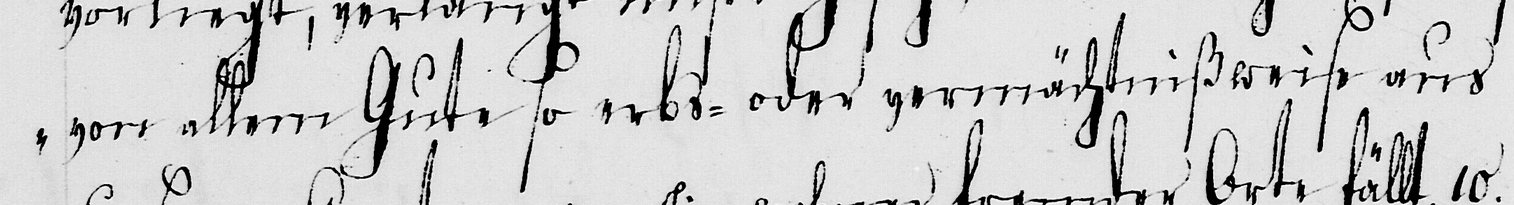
von allem Gute so erbs- oder vermächtnißweise aus
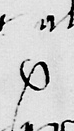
10.
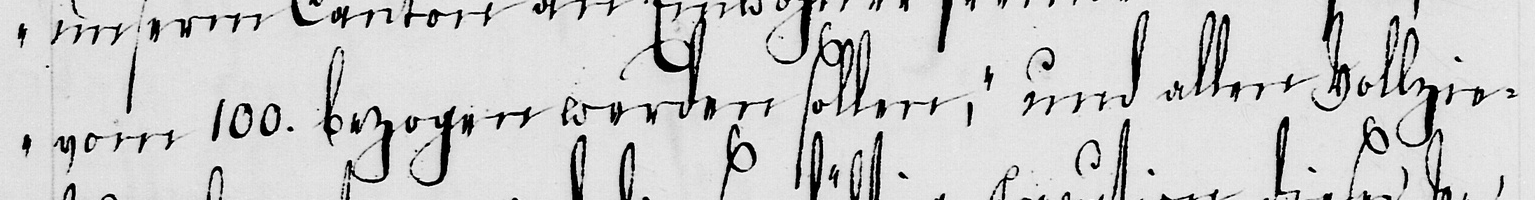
vom 100. bezogen werden sollen,“ und allen Vollzie¬
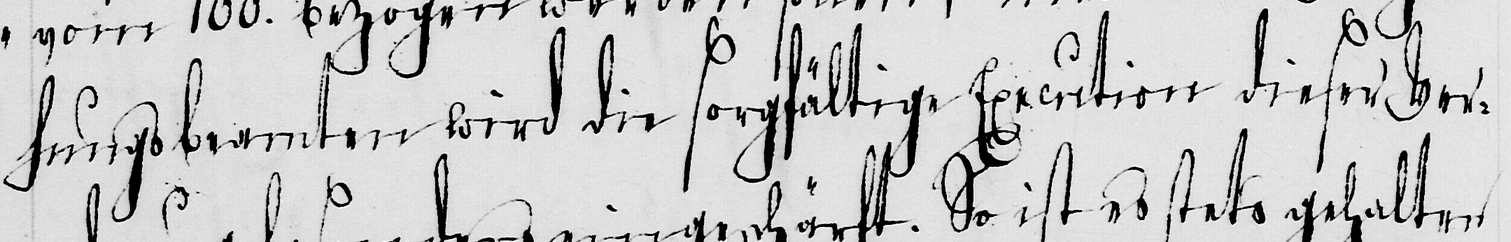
hungsbeamten wird die sorgfältige Execution dieser Ver¬
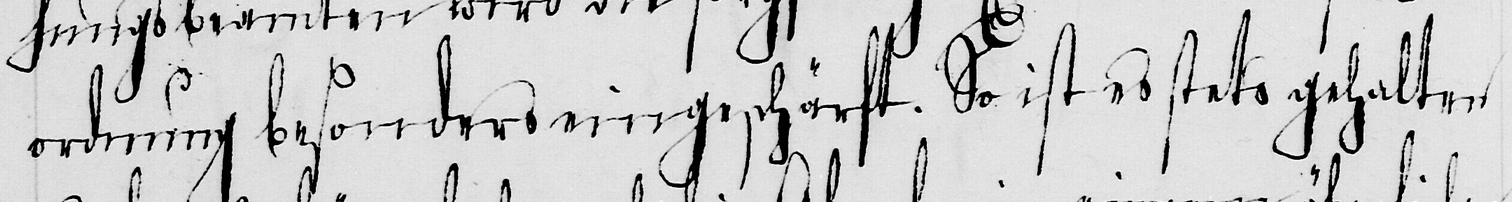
ordnung besonders eingeschärft. So ist es stets gehalten
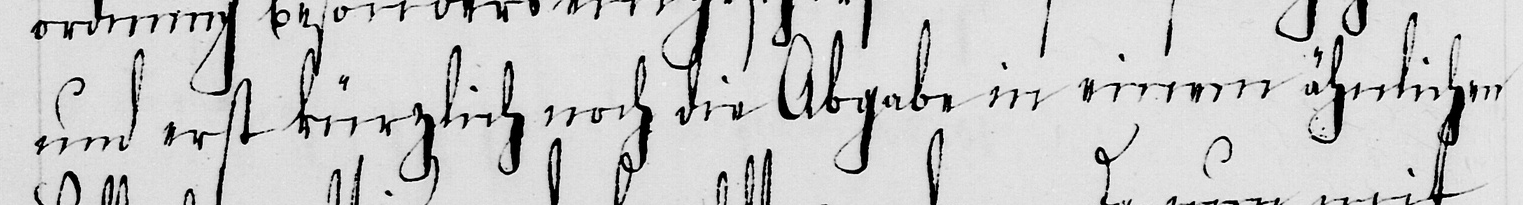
und erst kürzlich noch die Abgabe in einem ähnlichen
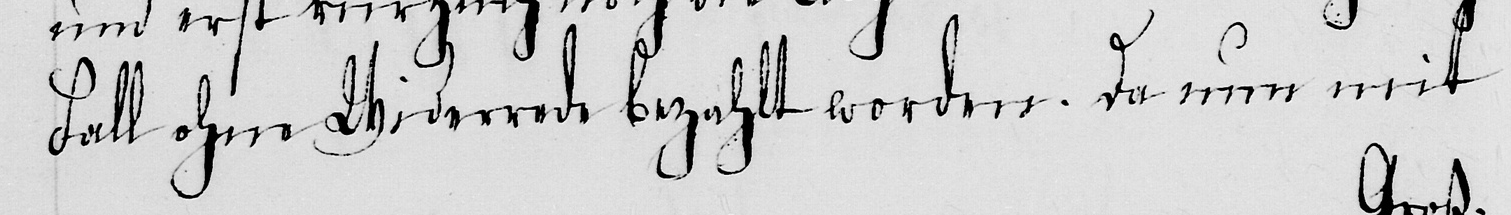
Fall ohne Wiederrede bezahlt worden. Da nun mit
